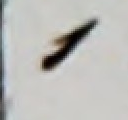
1
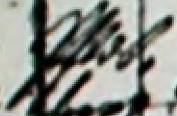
Pf???
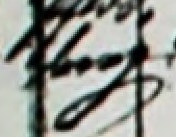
berg
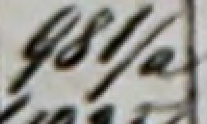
981/a
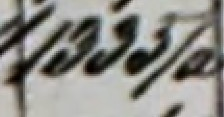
1335/a
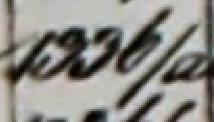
1336/a
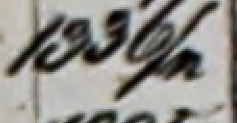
1336/n
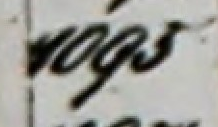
1095
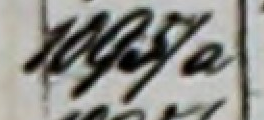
1095/a
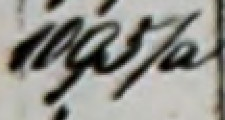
1095/a
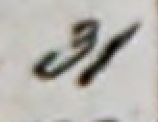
31
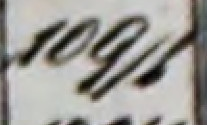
109/6
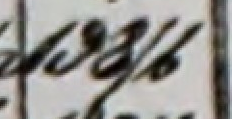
198/6
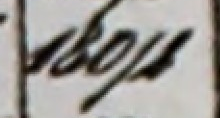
180/6
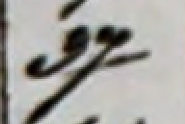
37
